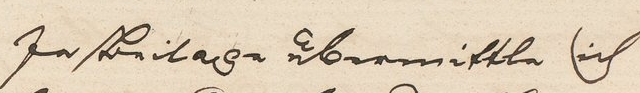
In Beilage übermittle ich
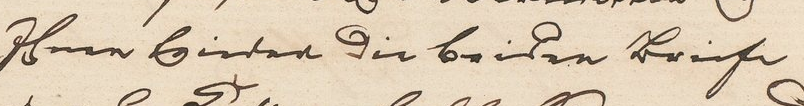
Ihnen wieder die beiden Briefe
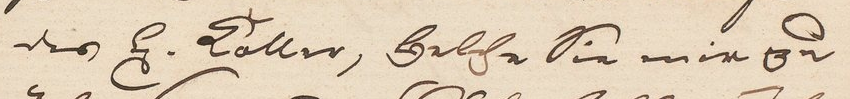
des H. Koller, welche Sie mir zu
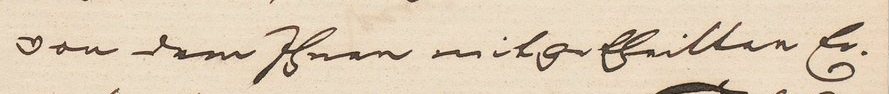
von den Ihnen mitgetheilten Er-
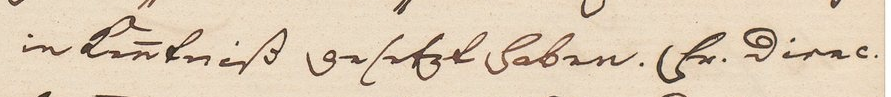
in Kenntniß gesetzt haben. Hr. Direc-
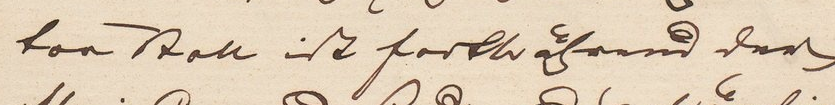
tor Stoll ist fortwährend der
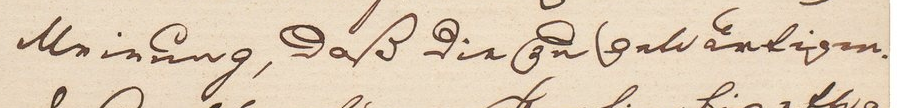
Meinung, daß die zu gewärtigen-
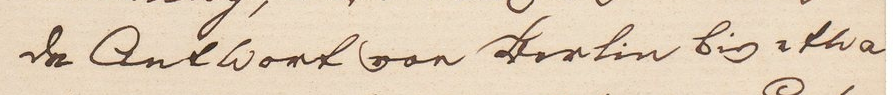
de Antwort von Berlin bis etwa
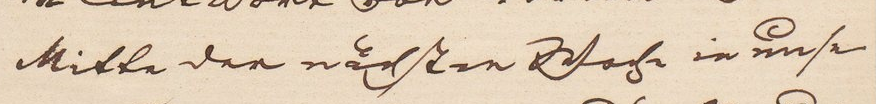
Mitte der nächsten Woche in unse-
